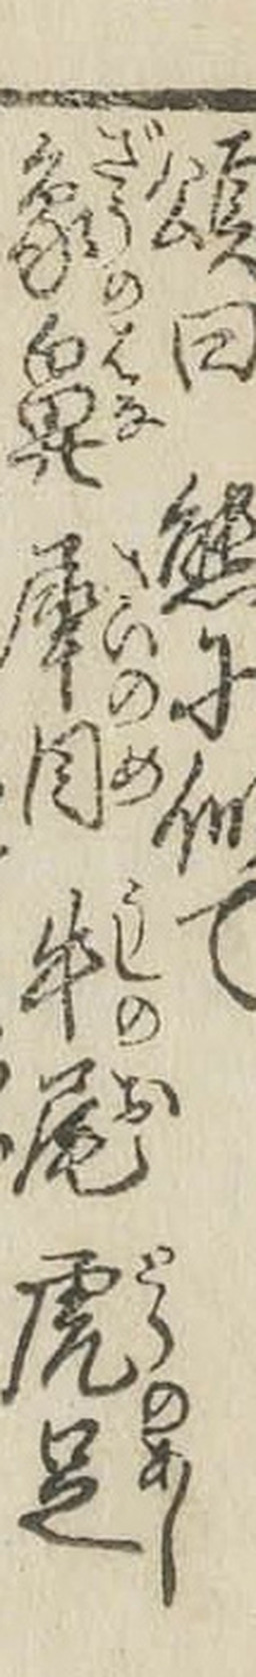象鼻犀目牛尾虎足
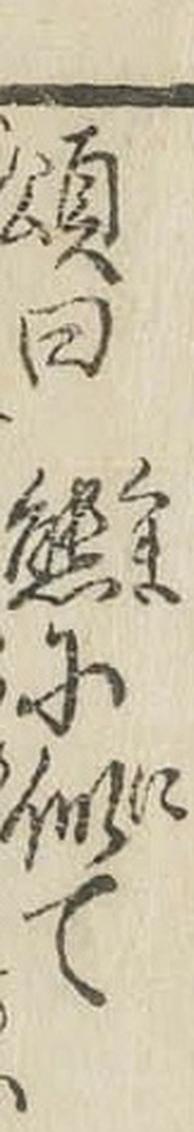頌曰熊に似て
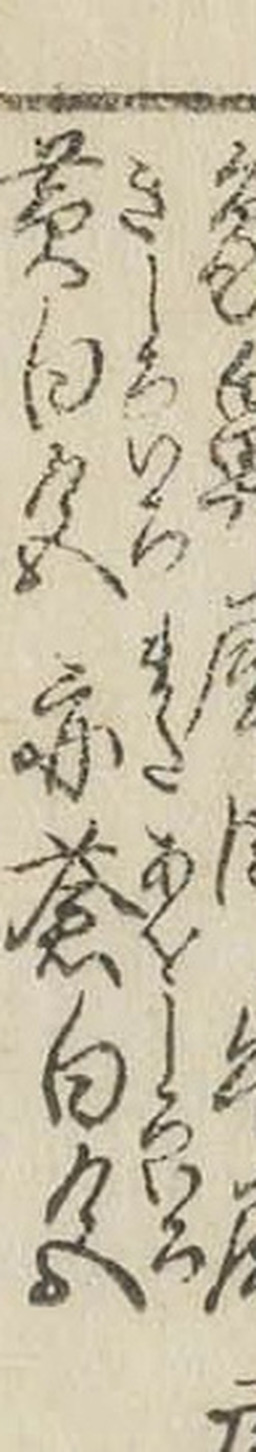黄白色亦蒼白色
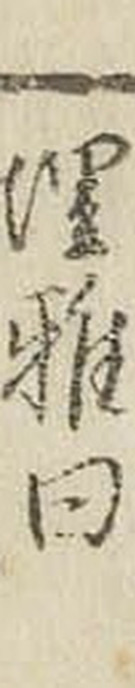埋雅曰

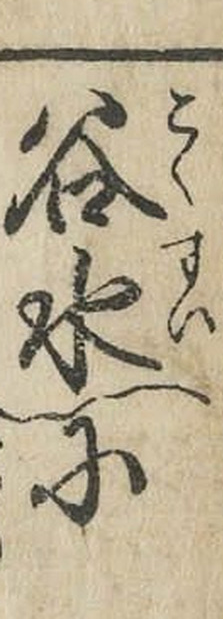谷水に

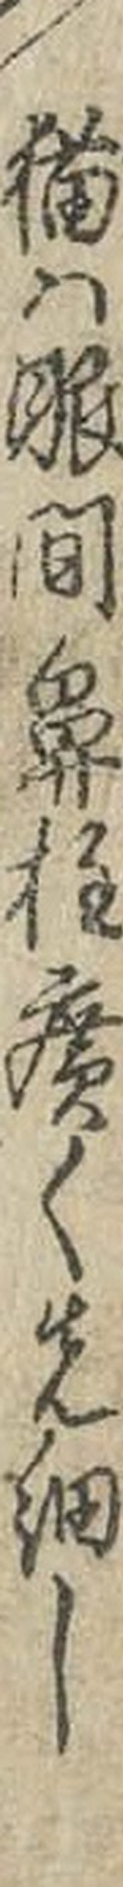猫は眼間鼻柱広く先細し
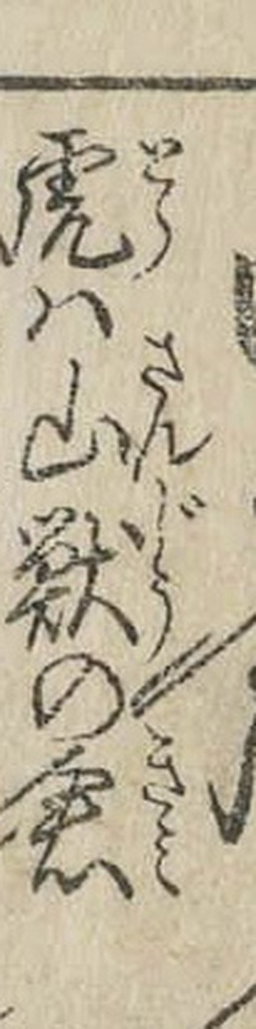虎は山獣の君
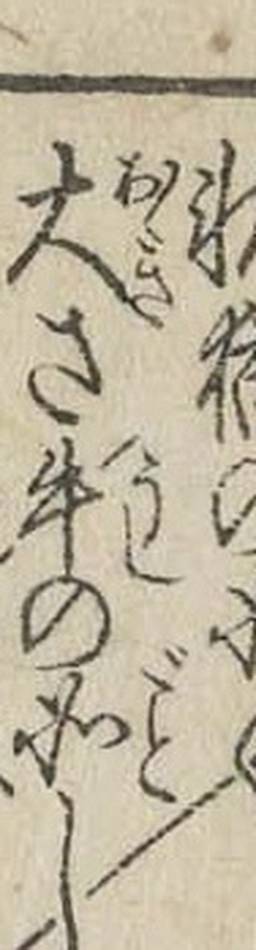大さ牛の如し
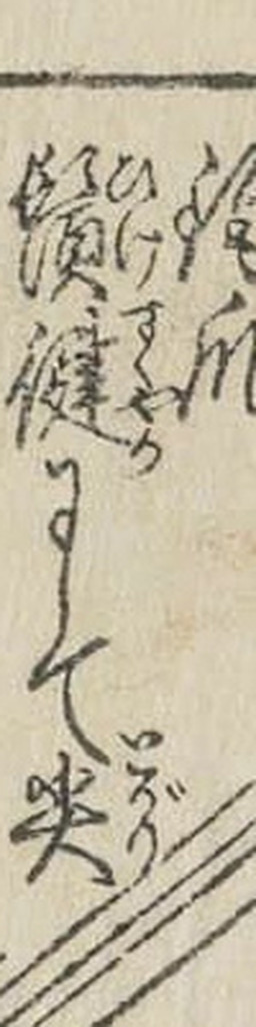鬚健にして尖
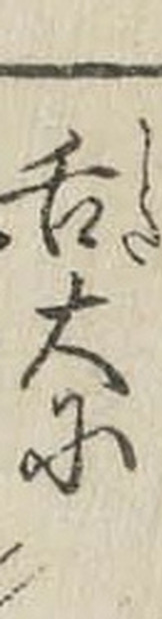舌大に
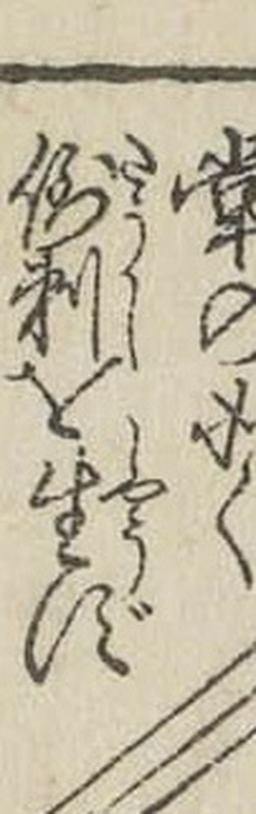倒刺を生ず
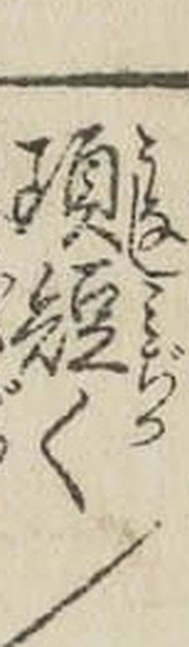項短く
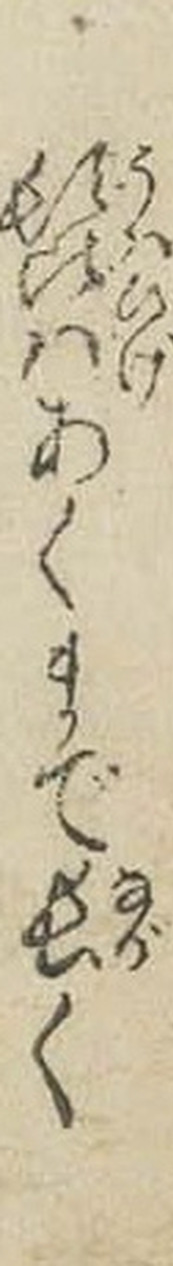髭はあくまで長く
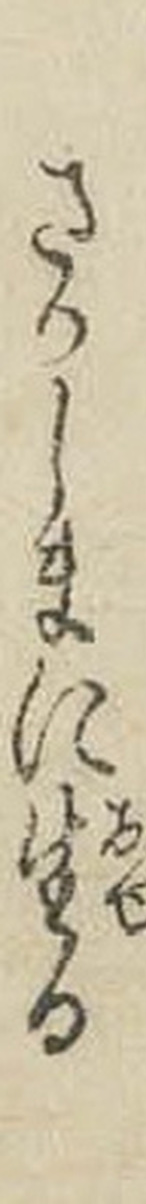さかしまに生る
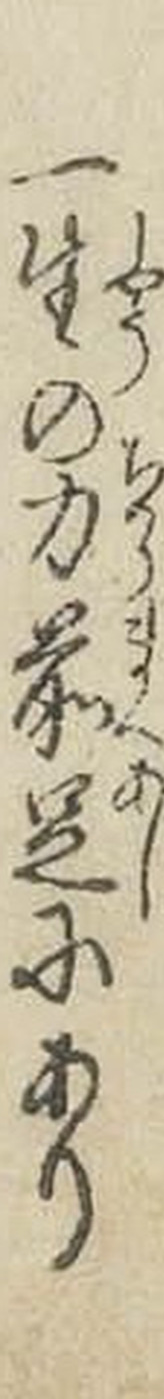一生の力前足にあり
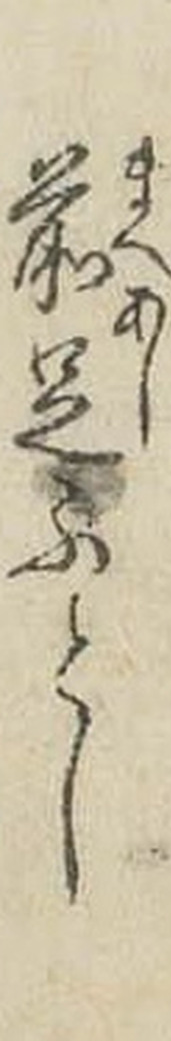前足ふとし
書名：絵本写宝袋 9巻 9之巻上
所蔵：東京学芸大学教育コンテンツアーカイブ
